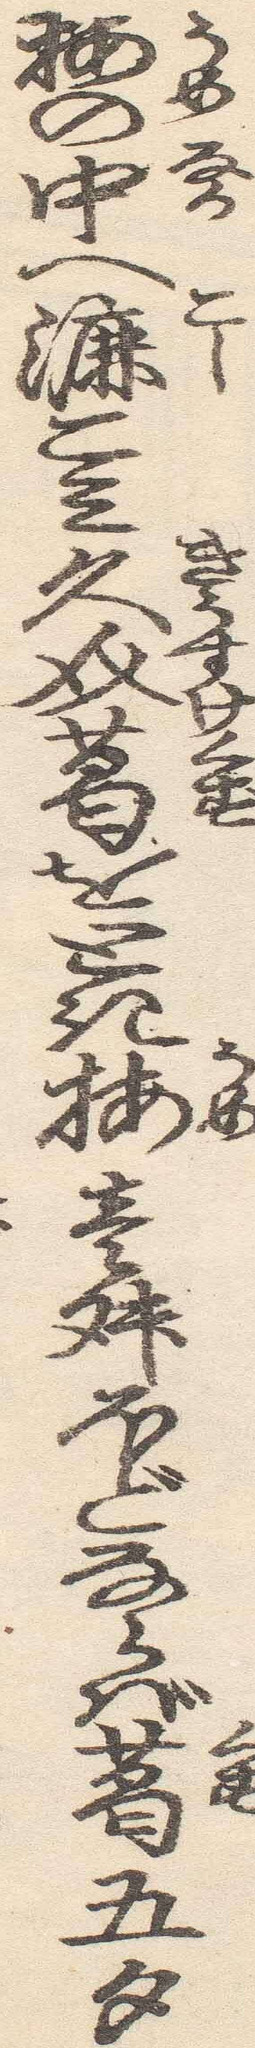梅の中へ漉こみ久助葛をとき梅壱舛ほどならば葛五勺
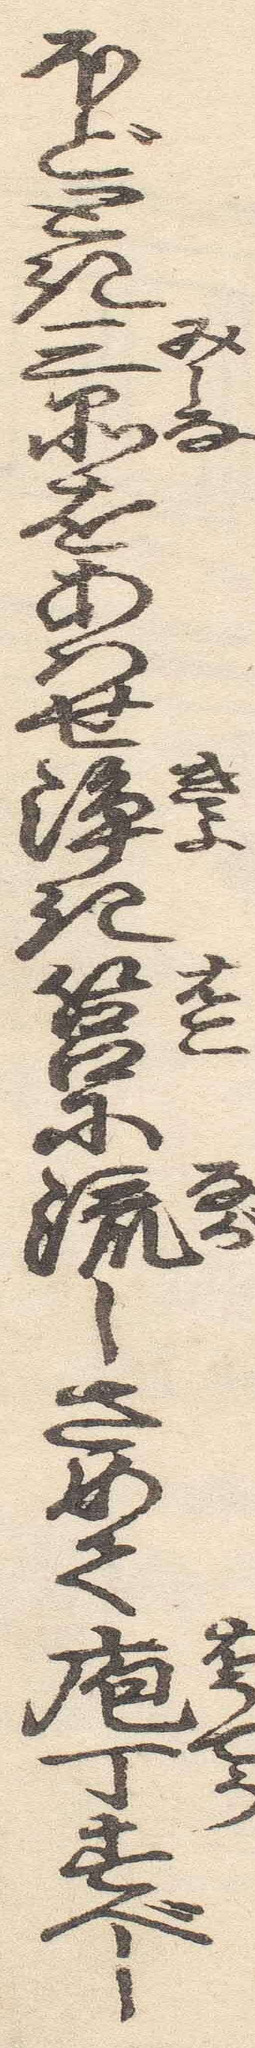ほどとき三品をあはせ浄き筥を流しさめて庖丁すべし
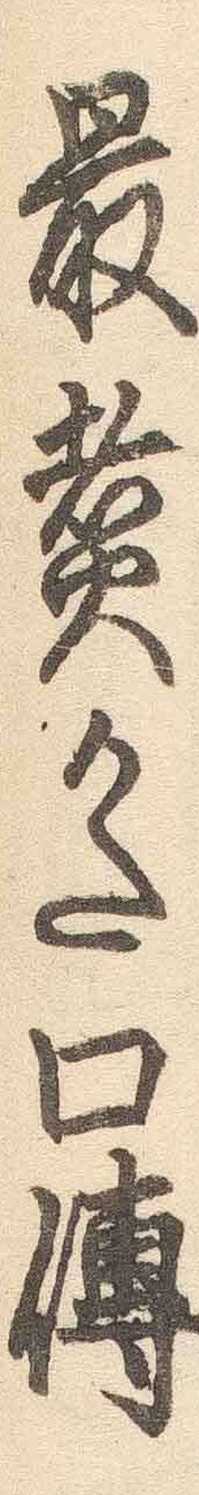最煮かた口伝
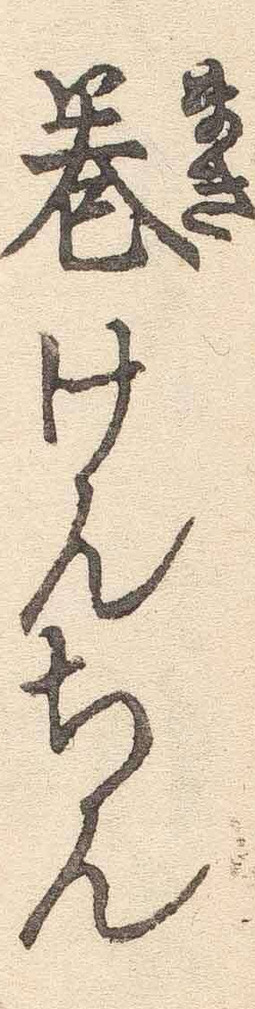巻けんちん
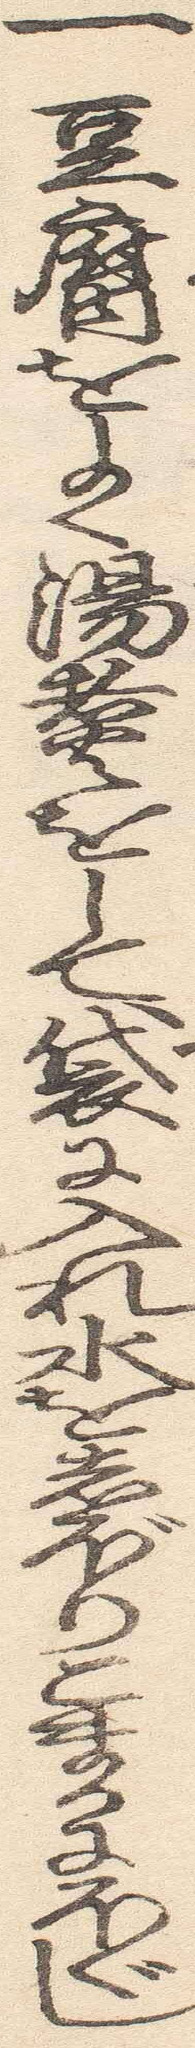一豆腐をよく湯煮をして袋に入れ水をしぼりこまかにほぐし
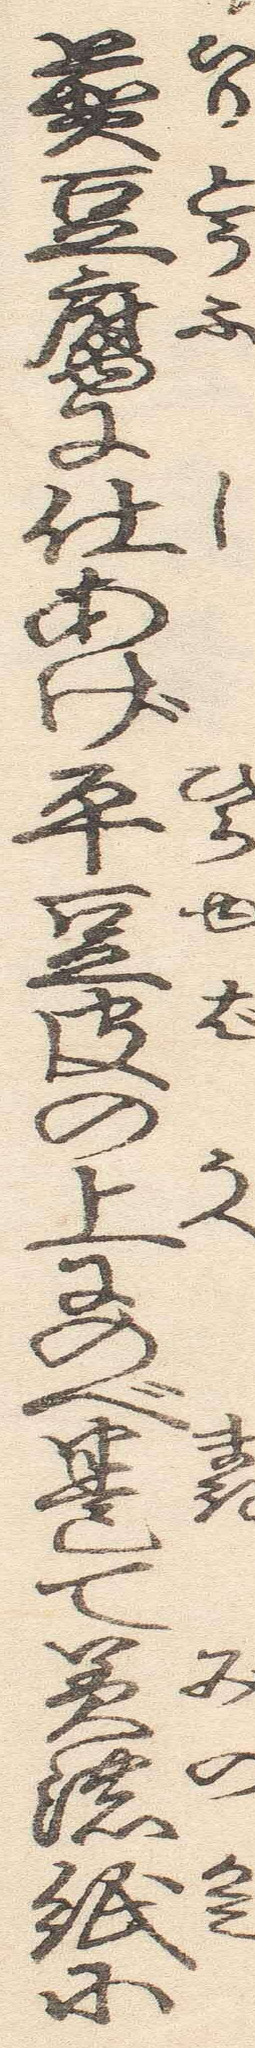煎豆腐に仕あげ平豆皮の上にのべ巻て美濃紙に
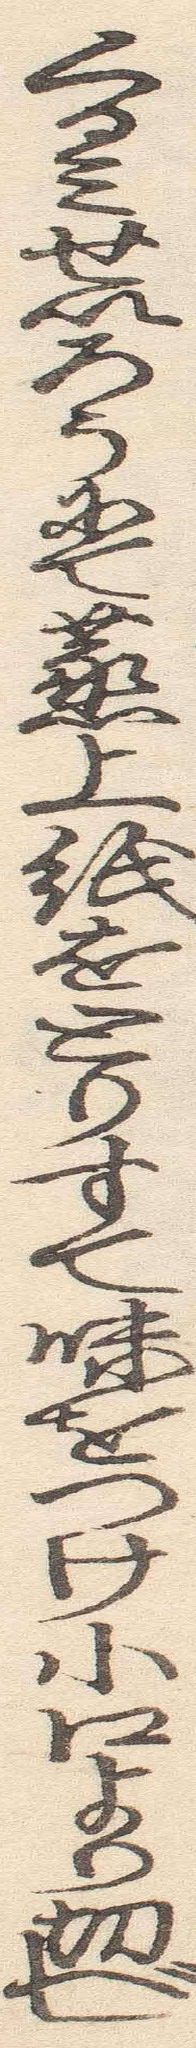くるみせいろうにて蒸上紙をとりすて味をつけ小口より切べし
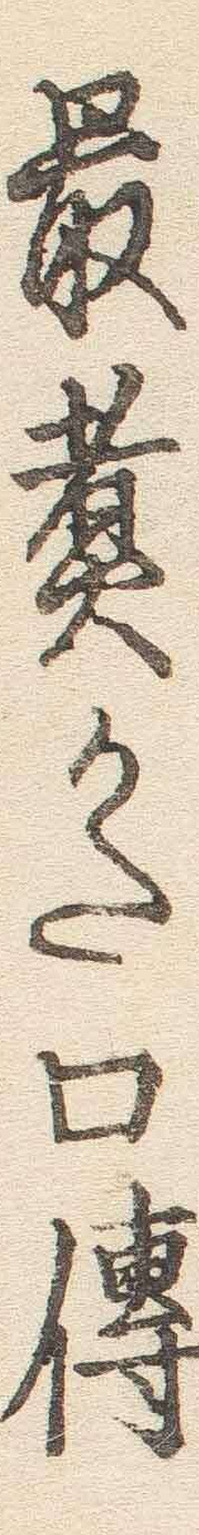最煮かた口伝
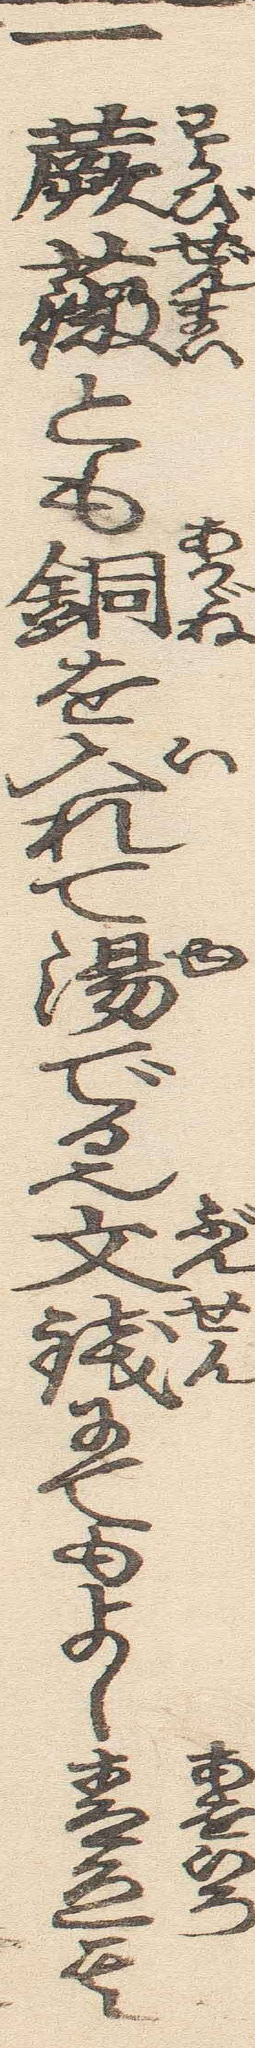一蕨薇とも銅を入れて湯でる也文銭にてもよし青色其
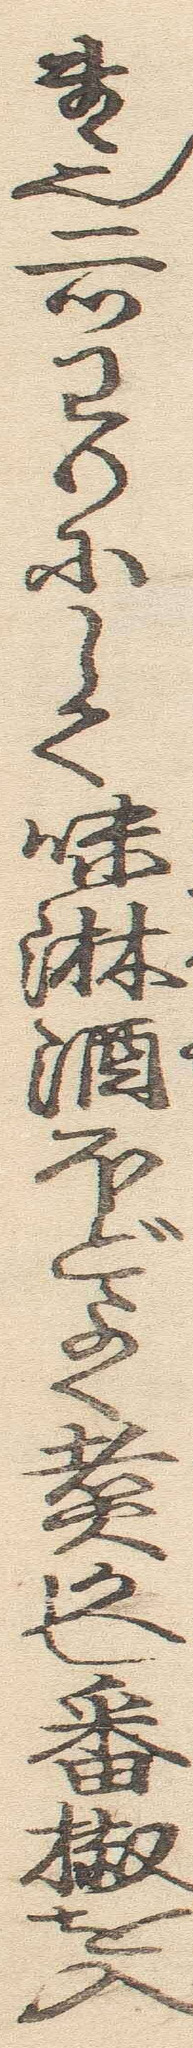まゝ也二つわりにして味淋酒ほどよく煮かへし番椒を入

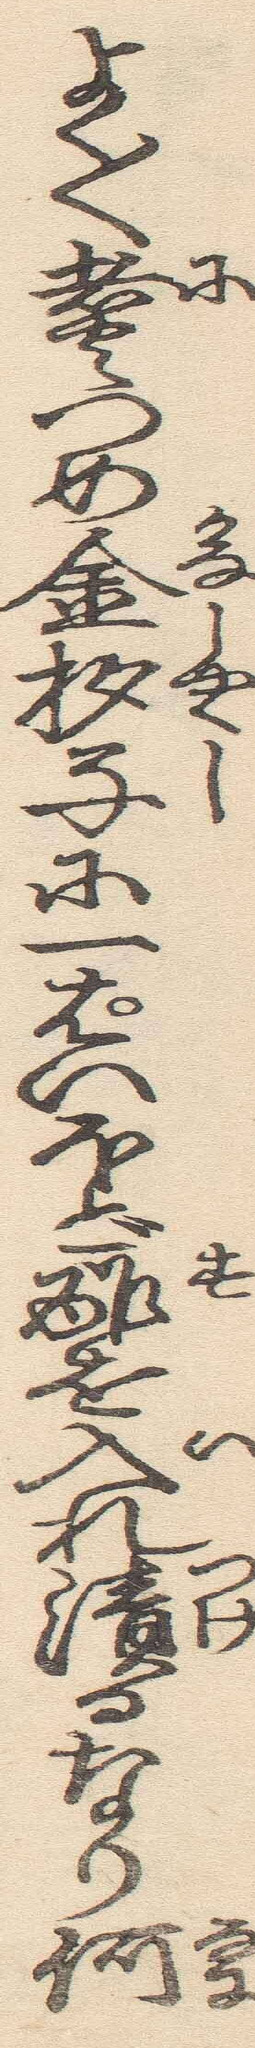よく煮つめ金杓子に一ぱいほど酢を入れ漬るなり何
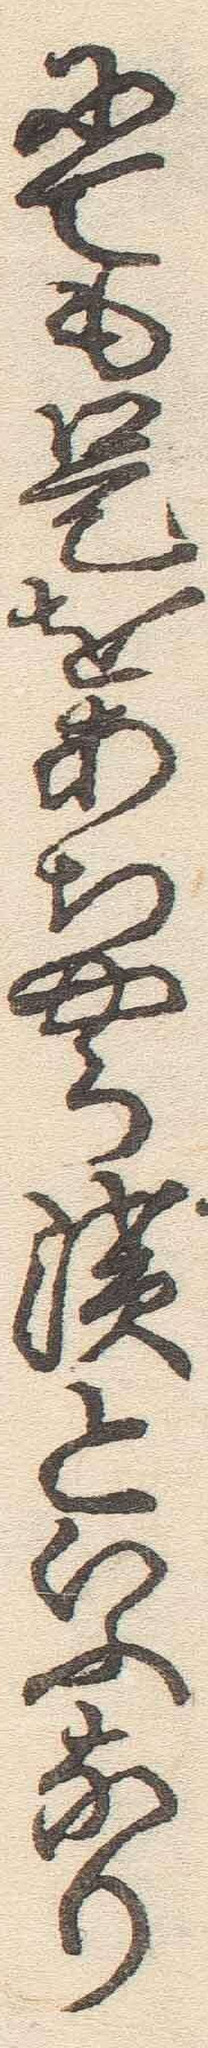にても是をあちやら漬といふなり
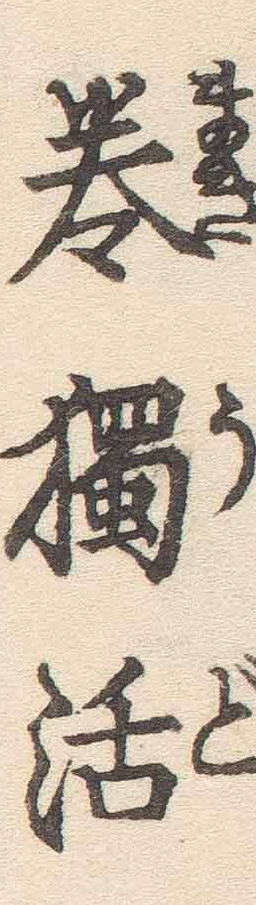巻独活
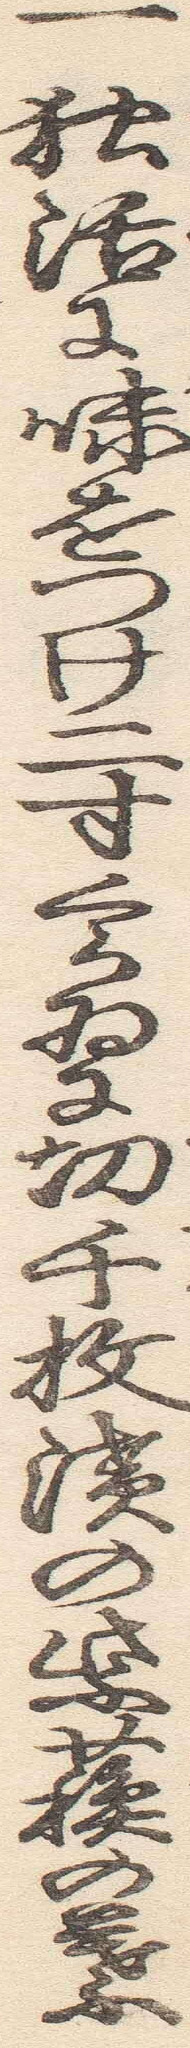一独活に味をつけ二寸くらゐに切千枚漬の紫蘇の葉
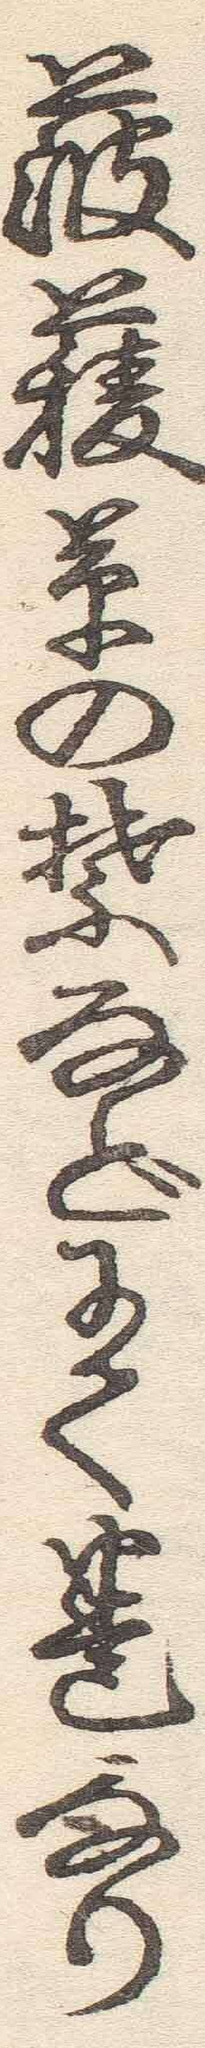菠薐草の葉などにて巻なり
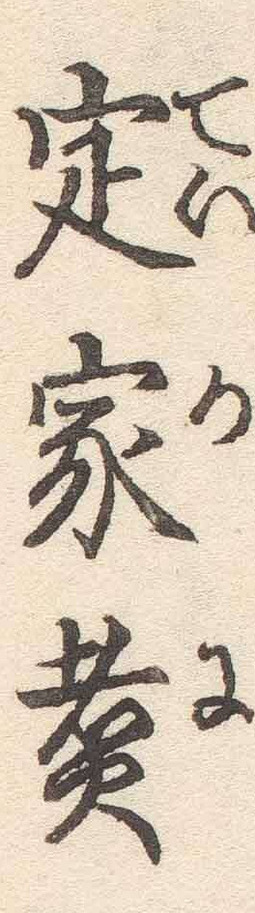定家煮
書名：料理通
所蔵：東京学芸大学附属図書館 国文学研究資料館
